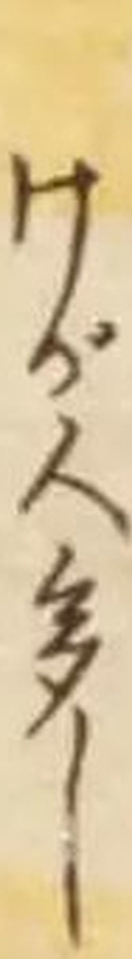けが人多し
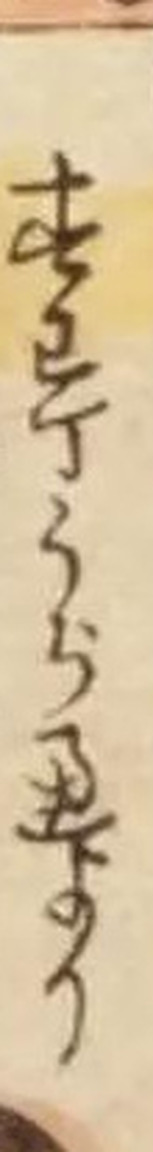すわ丁うら通より
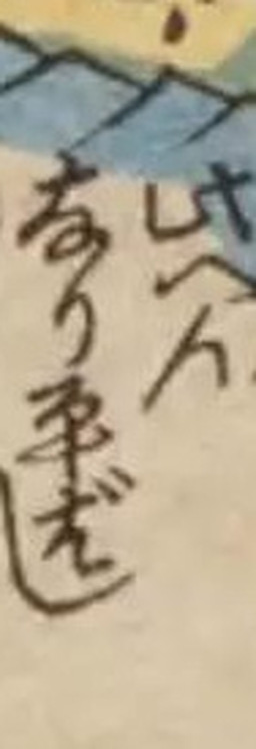なり平ばし
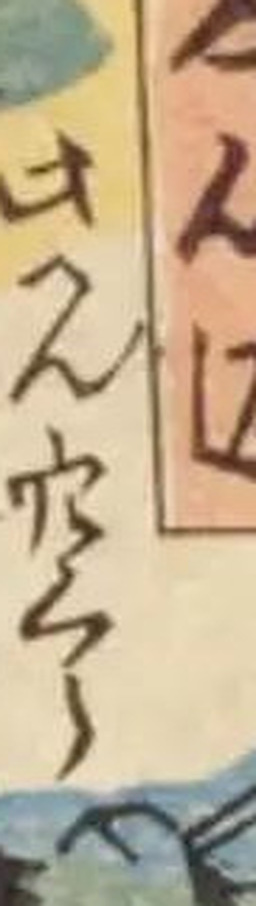此へん穴くら
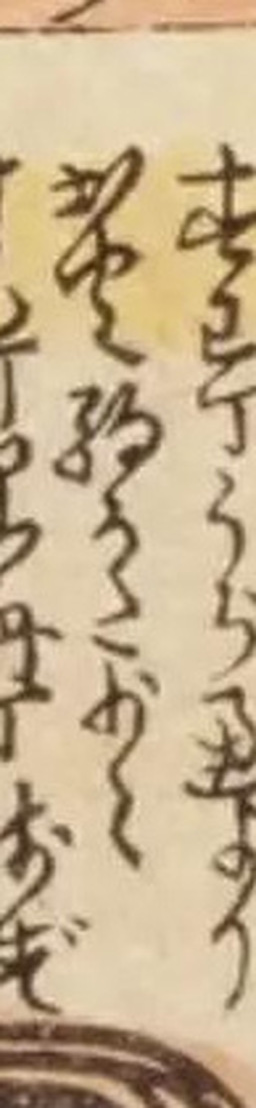出火駒かた少々
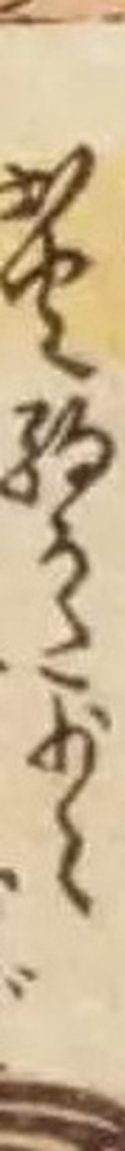出火駒かた少々
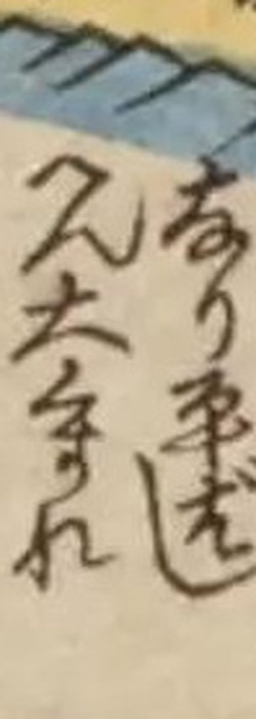へん大くずれ
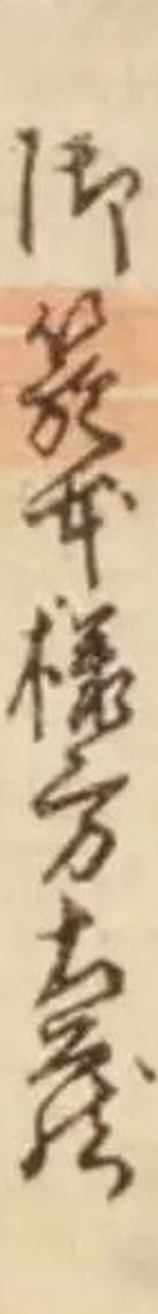御旗本様方土蔵
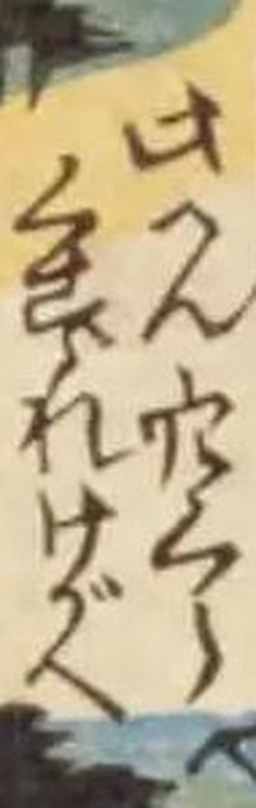くすれけがん
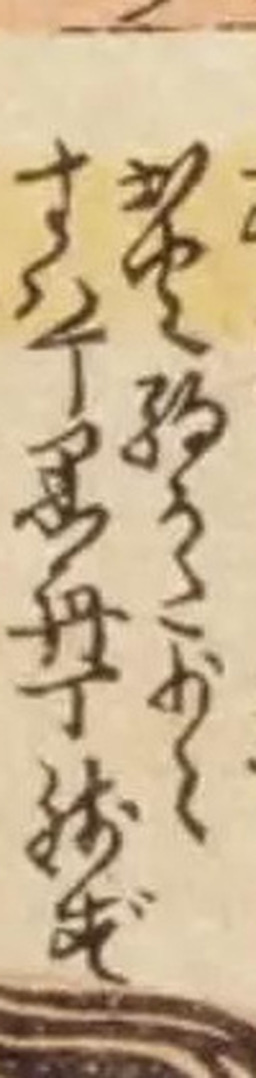すは丁黒舟丁殘ず
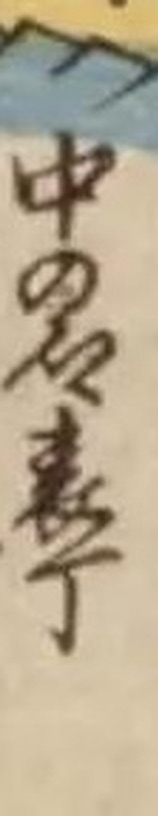中の郷表丁
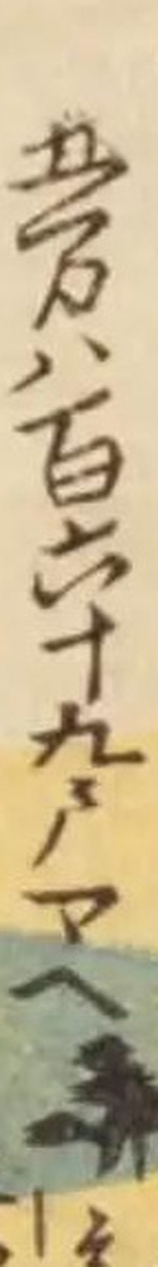五万八百六十九戸まへ
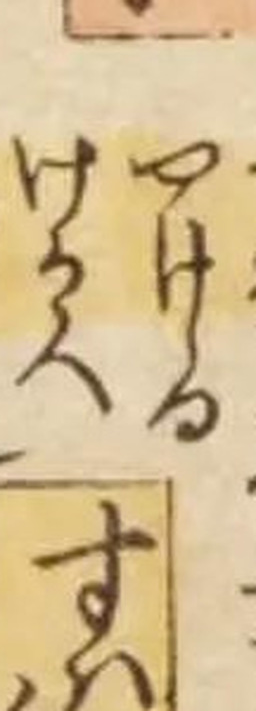けか人
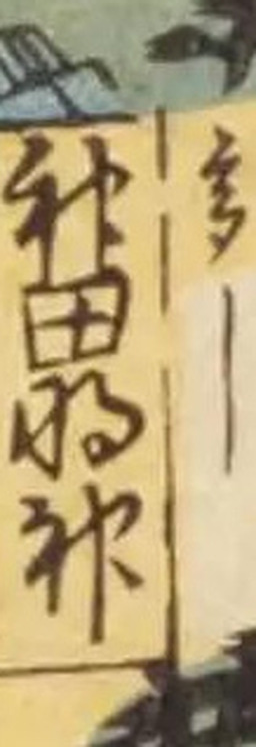神田明神
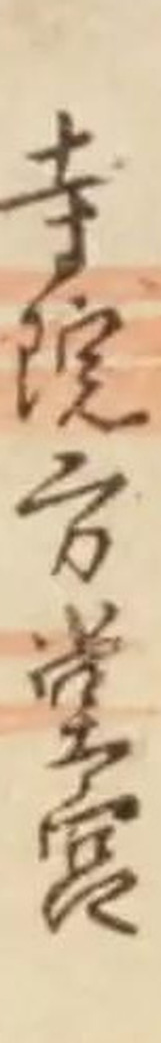寺院方堂宮
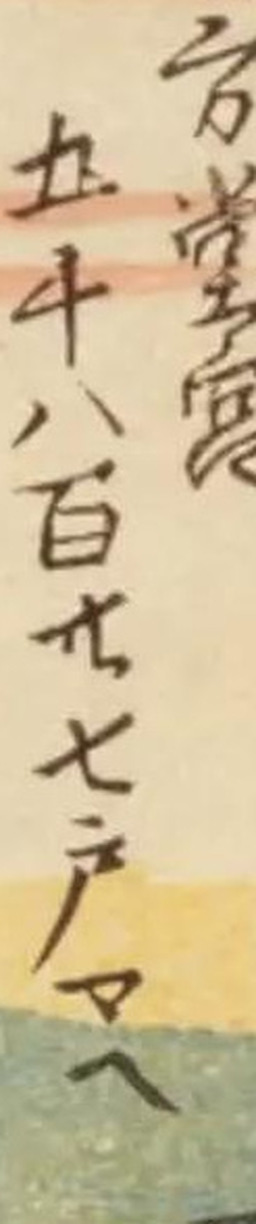五千八百廿七戸まへ
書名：銘細改板江戸大地震出火場所附
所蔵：国立国会図書館 National Diet Library, JAPAN
